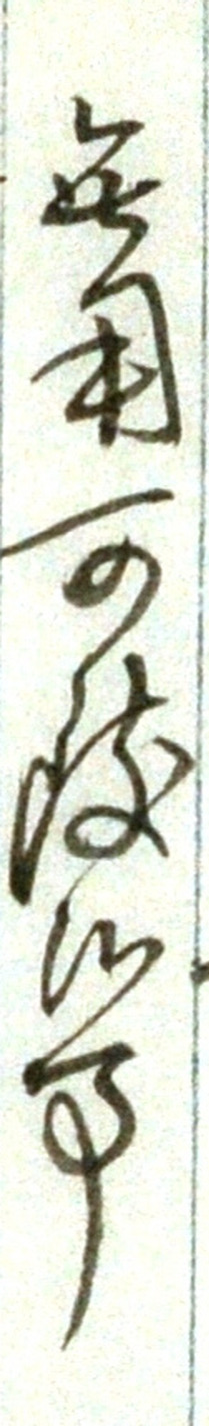無用可致候事
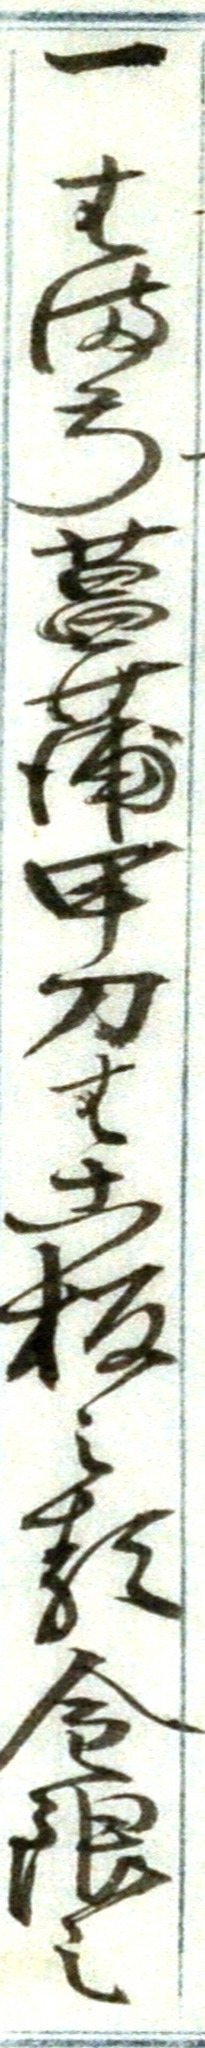一はま弓菖蒲甲刀者古板之類金銀之
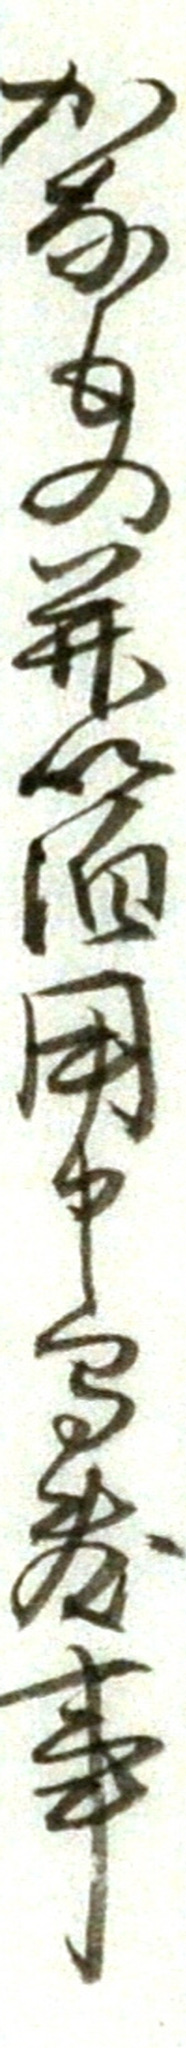かなもの幷箔用申間敷事
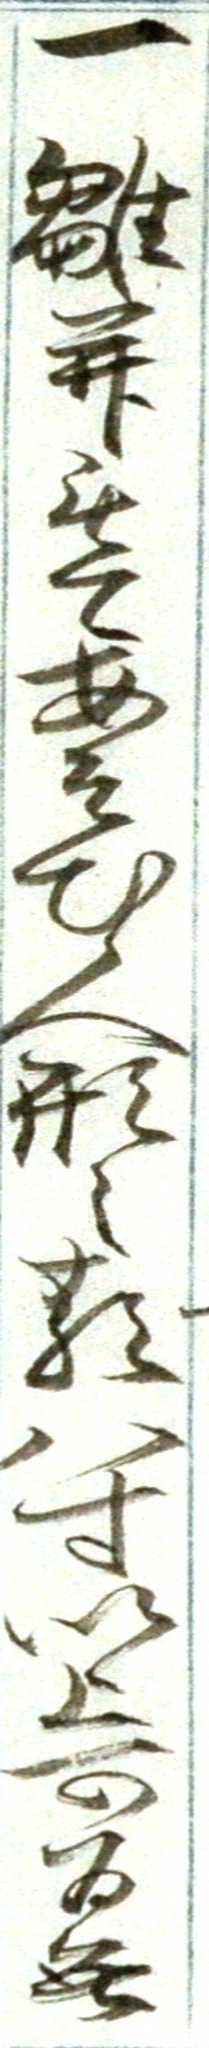一雛幷もてあそひ人形之類八寸以上可為無
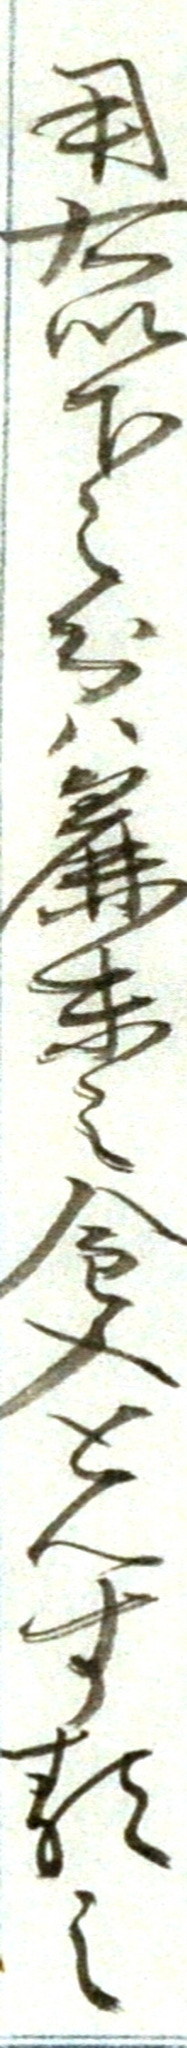用右以下之分ハ麁末之金入とんす類之
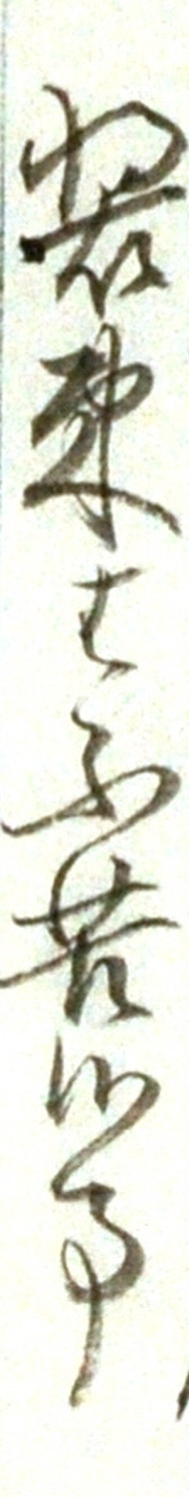装束者不苦候事
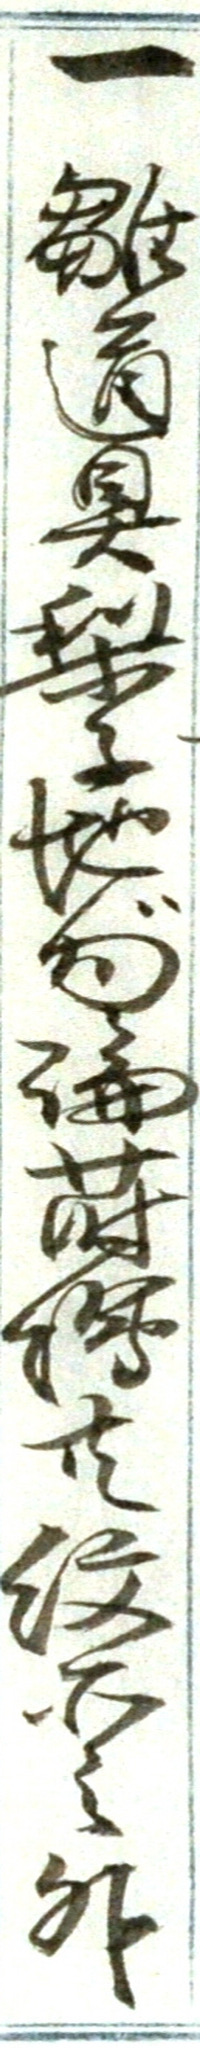一雛道具梨子地ハ勿論蒔絵共紋所之外
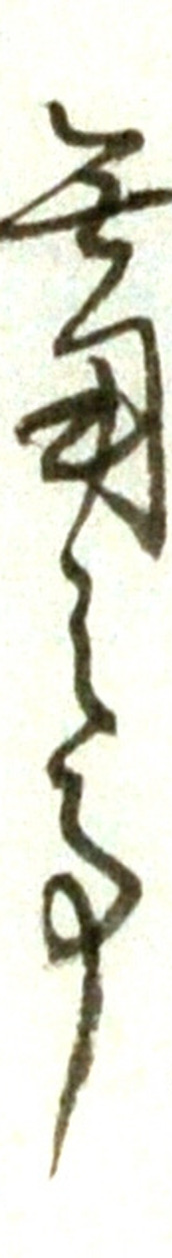無用之事
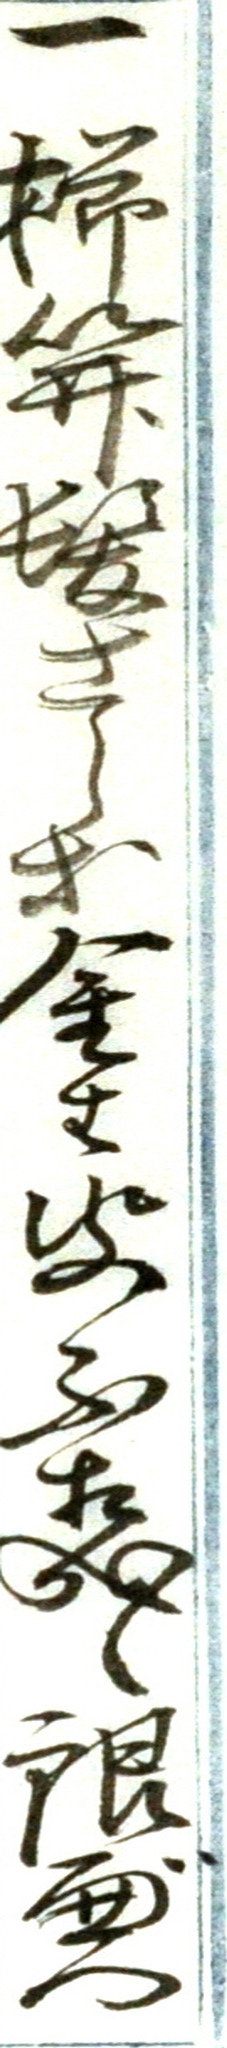一櫛笄髪さし等金者決不相成候銀べつ
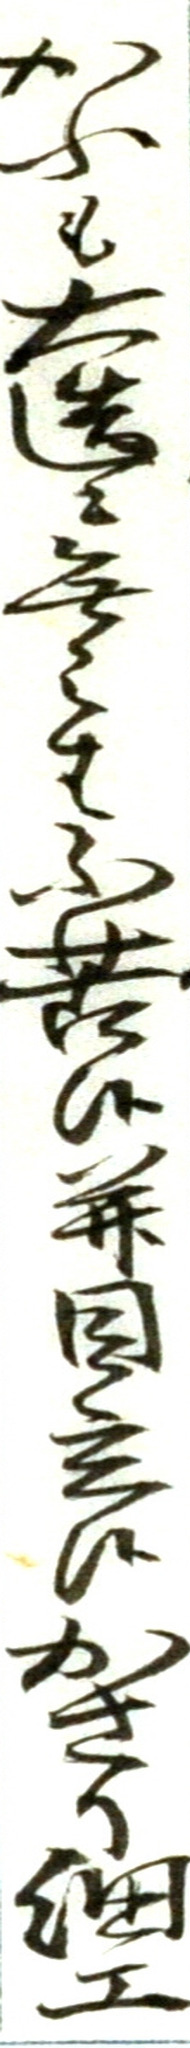かふも大造ニ無之者不苦候幷目立候かさり細工
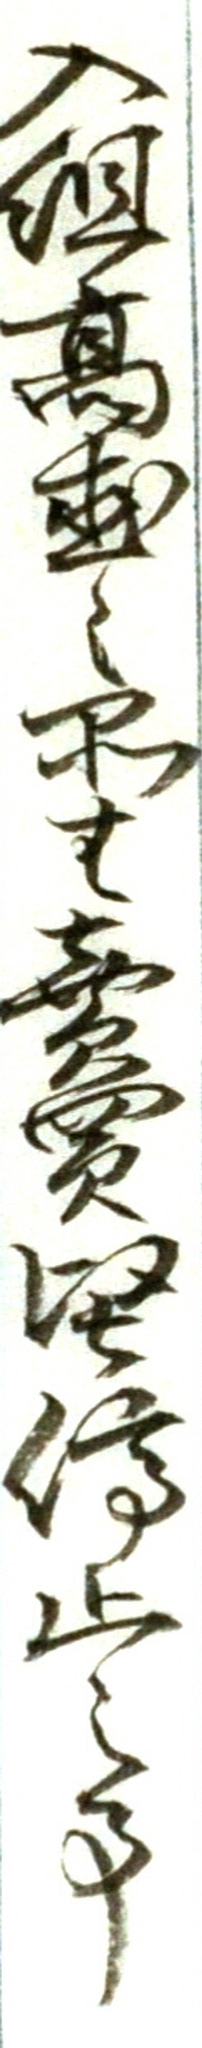入組高直之品者売買堅停止之事
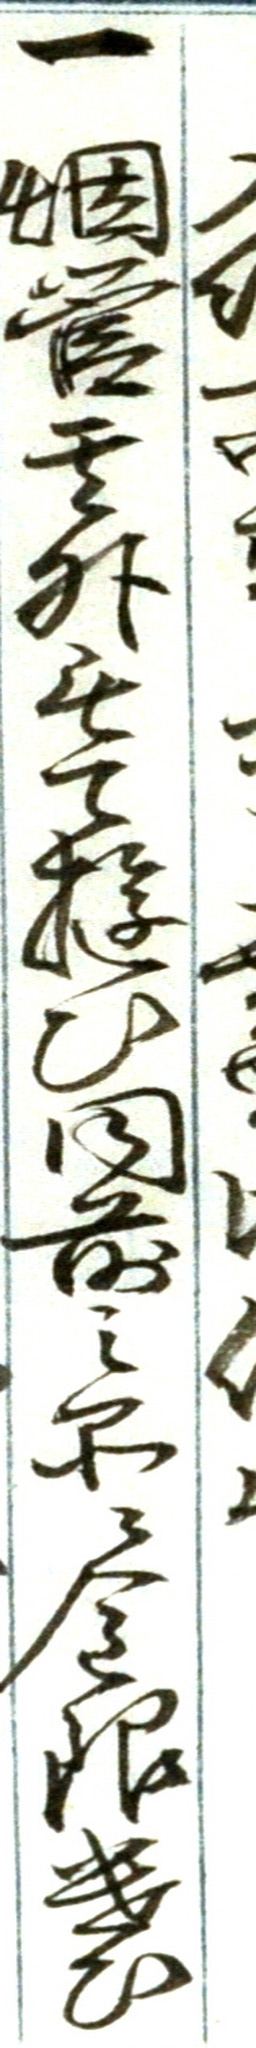一烟管其外もて遊ひ同前之品ニ金銀遣ひ
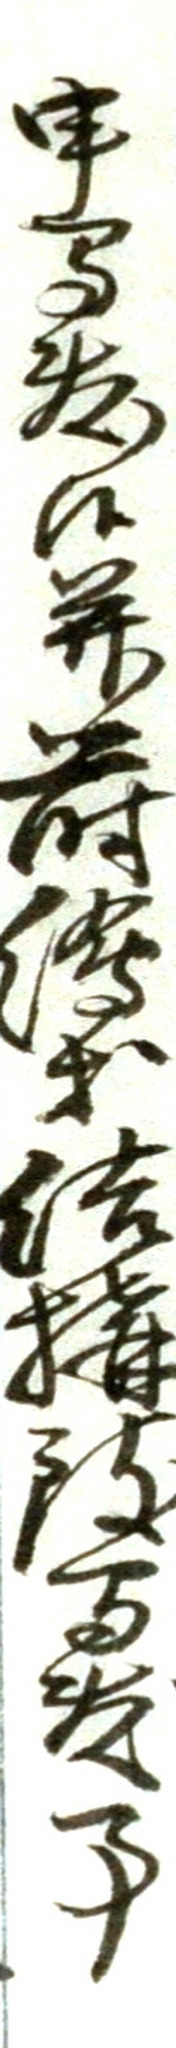申間敷候幷蒔絵等結構致間敷事
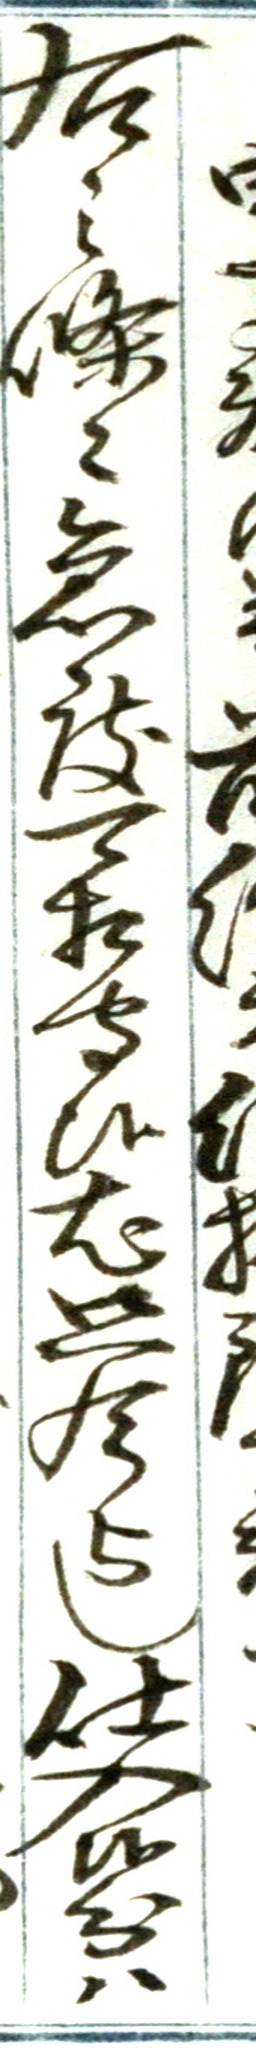右之條々急度可相守候尤只今迄仕入候分ハ
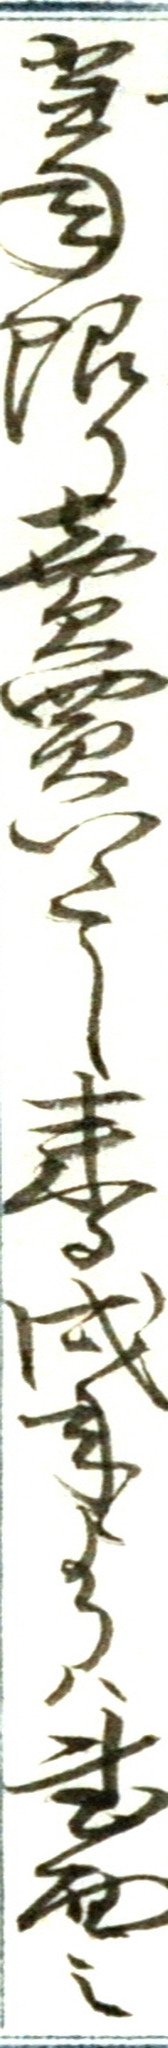当年限り売買いたし来る戌年よりハ書面之
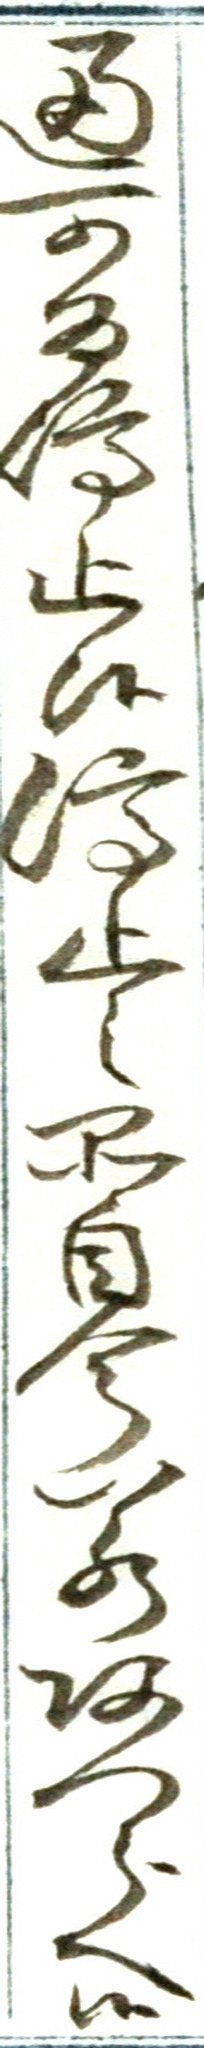通可為停止候停止之品自今別あつらへ候
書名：町方御触書・二通
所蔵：伊那市立高遠町図書館・合同会社AMANE
